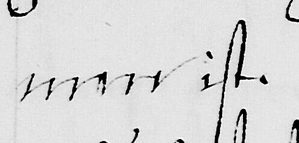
men ist.
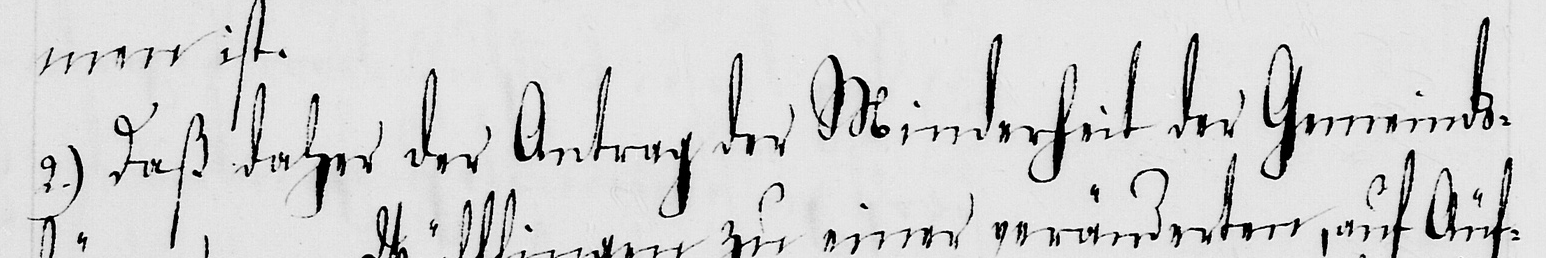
2.) Daß daher der Antrag der Minderheit der Gemeinds¬
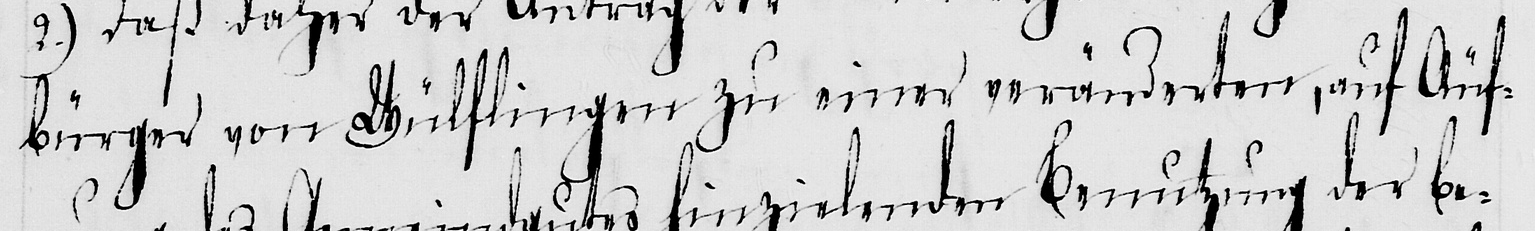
bürger von Wülflingen zu einer veränderten, auf Äuf¬
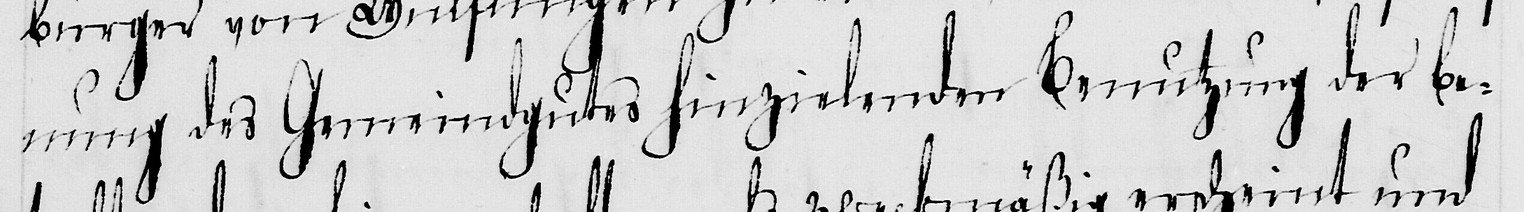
nung des Gemeindgutes hinzielenden Benutzung der be¬
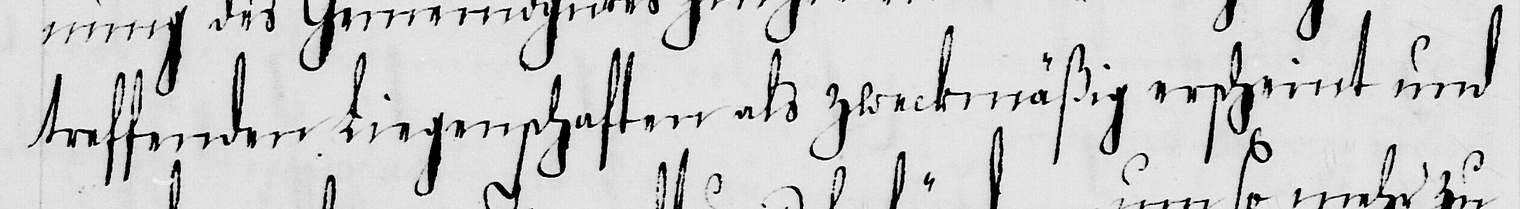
treffenden Liegenschaften als zweckmäßig erscheint und
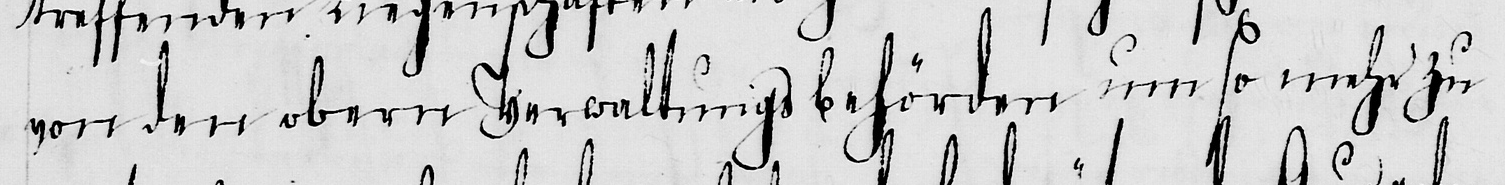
von den obern Verwaltungsbehörden um so mehr zu
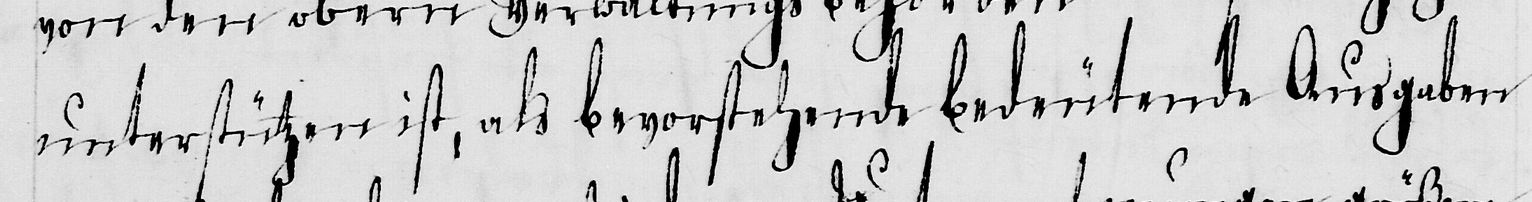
unterstützen ist, als bevorstehende bedeutende Ausgaben
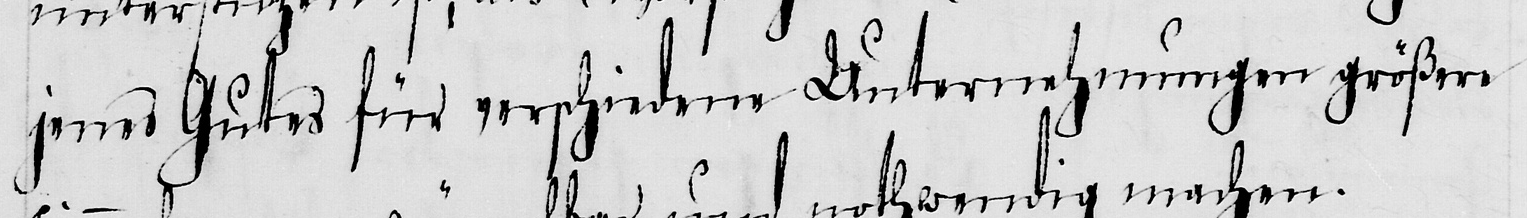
jenes Gutes für verschiedene Unternehmungen größere
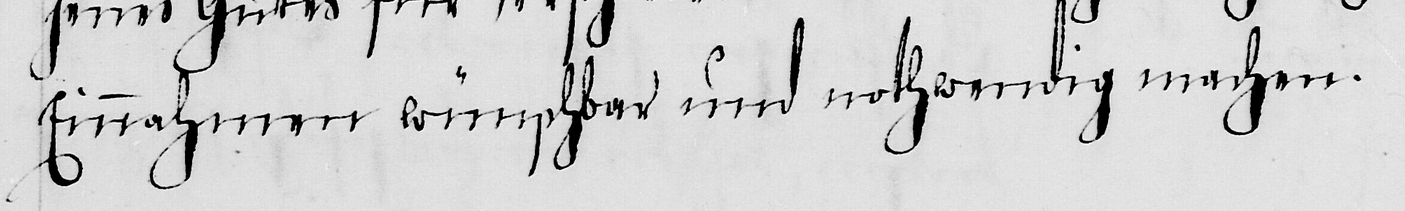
Einnahmen wünschbar und nothwendig machen.
